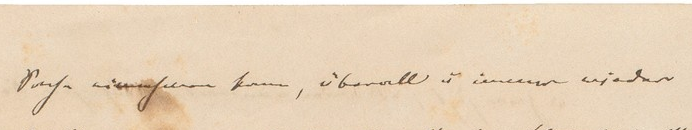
Sache einnehmen kann, überall u immer wieder
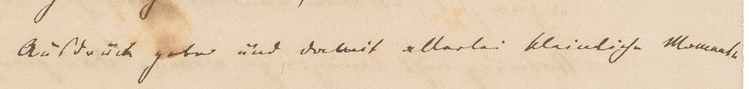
Ausdruck gebe und damit allerlei kleinliche Momente
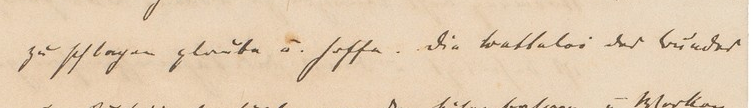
zu schlagen glaube u. hoffe. Die Bettelei des Bundes
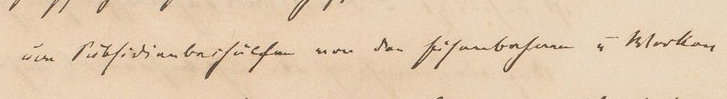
um Subsidienbeihülfen von den Eisenbahnen u Werken
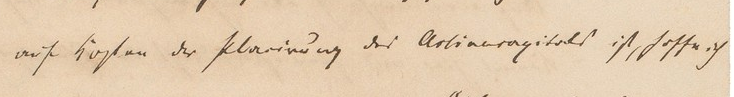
auf Kosten der Placirung des Aktiencapitals ist, hoffe ich
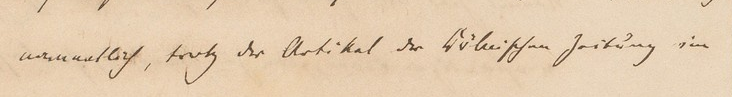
namentlich, trotz der Artikel der Kölnischen Zeitung im
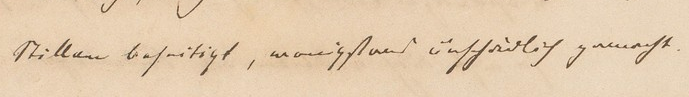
Stillen beseitigt, wenigstens unschädlich gemacht.
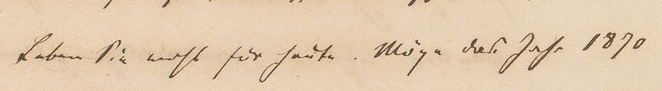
Leben Sie wohl für heute. Möge das Jahr 1870
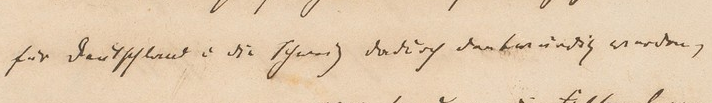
für Deutschland u die Schweiz dadurch denkwürdig werden,
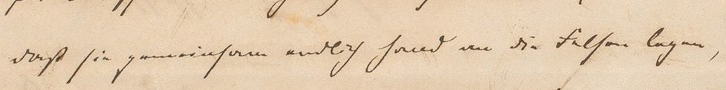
daß sie gemeinsam endlich Hand an die Felsen legen,
